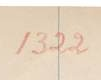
Florence
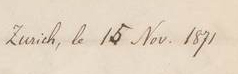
Zurich, le 15 Nov. 1871
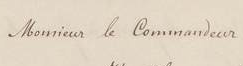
Monsieur le Commandeur
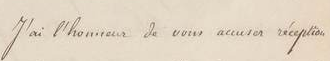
J'ai l'honneur de vous accuser réception
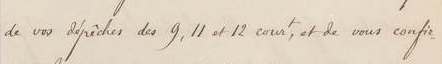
de vos dépêches des 9, 11 et 12 court, et de vous confir-
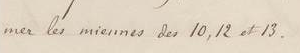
mer les miennes des 10, 12 et 13.
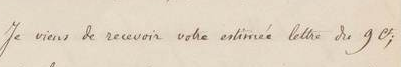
Je viens de recevoir votre estimée lettre du 9 Ct;
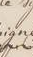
de
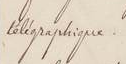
télégraphique.
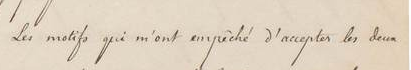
Les motifs qui m'ont empêché d'accepter les deux
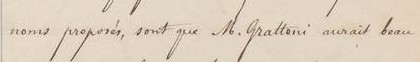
noms proposés, sont que M. Grattoni aurait beau
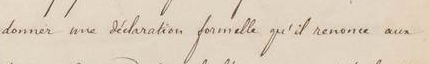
donner une déclaration formelle qu'il renonce aux
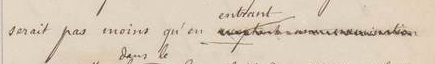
serait pas moins qu'en entrantaccpetant mon nomination
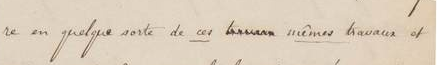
re en quelque sorte de cestravauxmêmes travaux et
